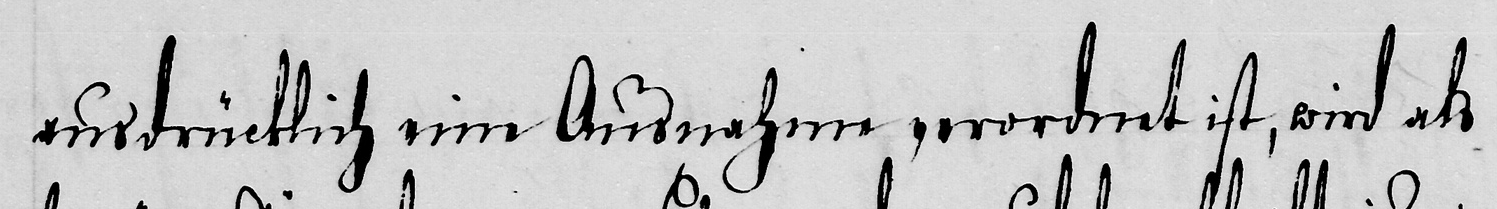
ausdrücklich eine Ausnahme verordnet ist, wird als
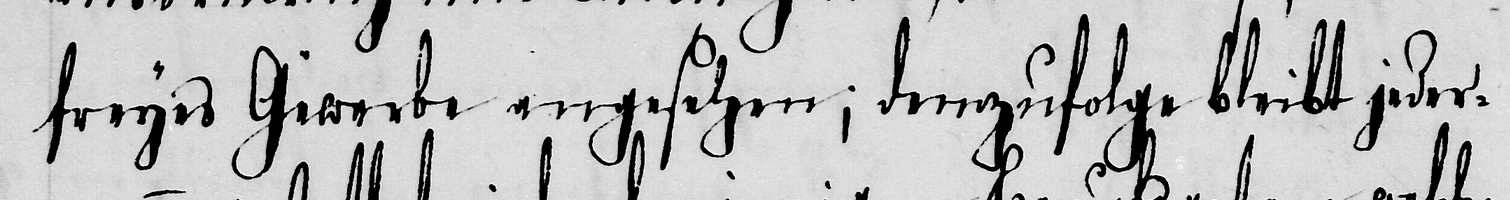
freyes Gewerbe angesehen; demzufolge bleibt jede¬
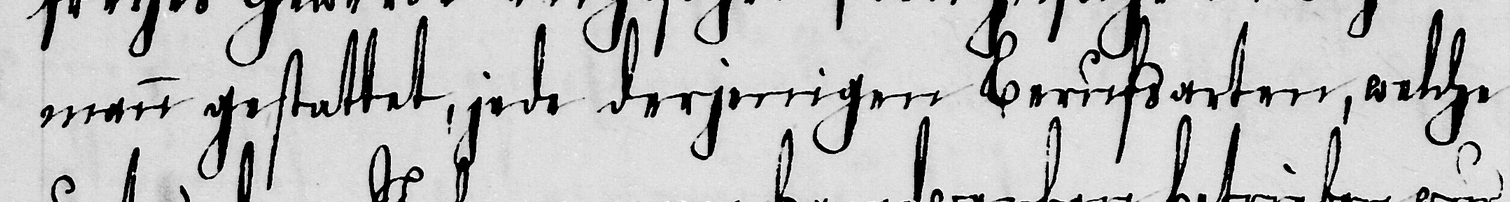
rmann gestattet, jede derjenigen Berufsarten, welche
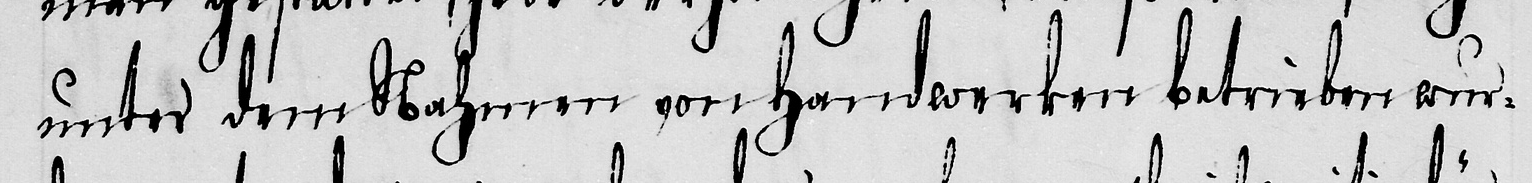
unter dem Nahmen von Handwerken betrieben wur¬
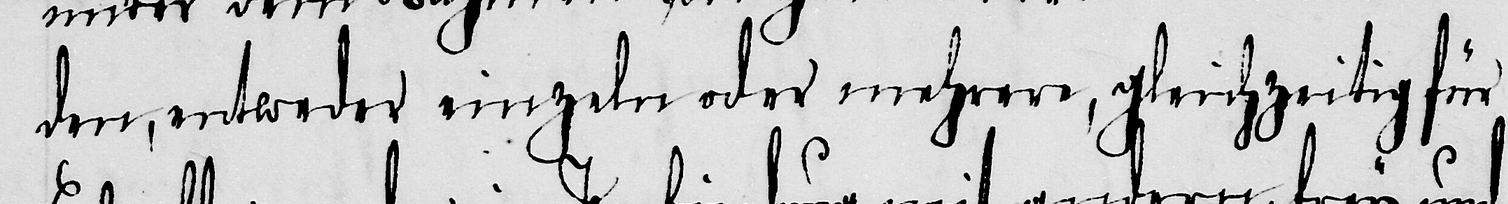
den, entweder einzeln oder mehrere, gleichzeitig für
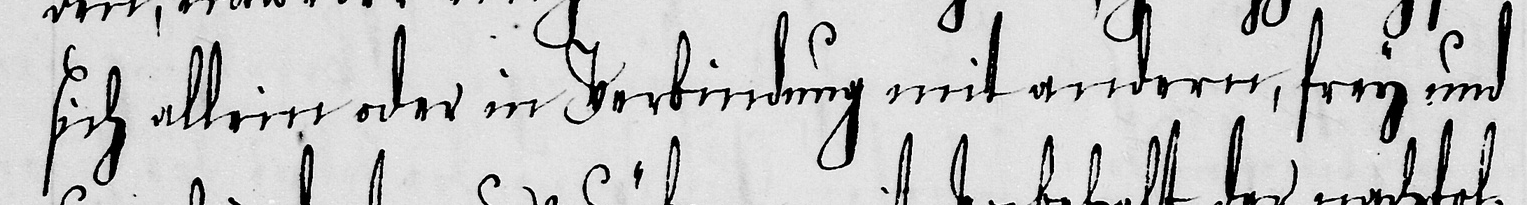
sich allein oder in Verbindung mit andern, frey und
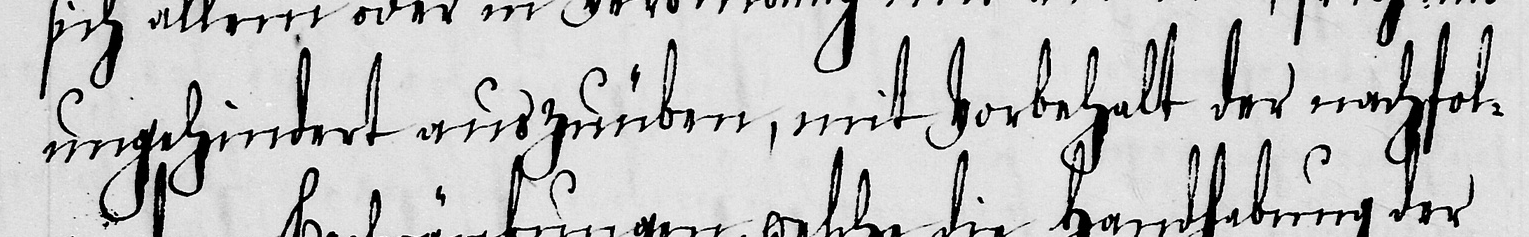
ungehindert auszuüben, mit Vorbehalt der nachfol¬
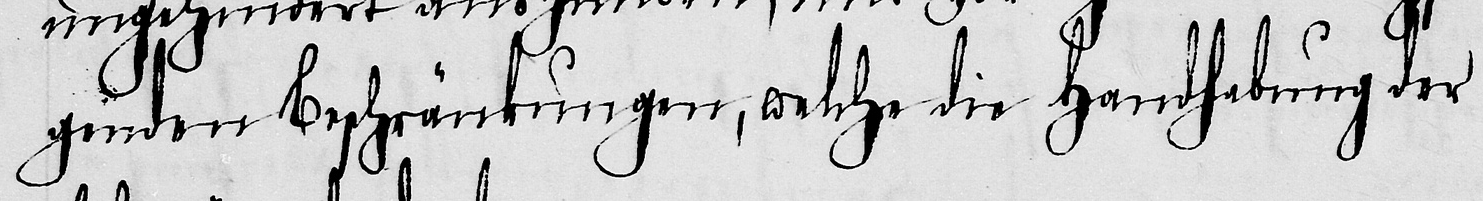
genden Beschränkungen, welche die Handhabung der
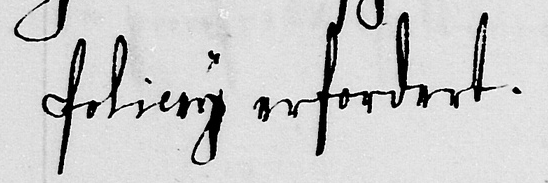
Policey erfordert.
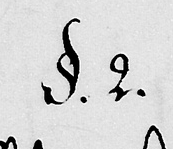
§. 2.
